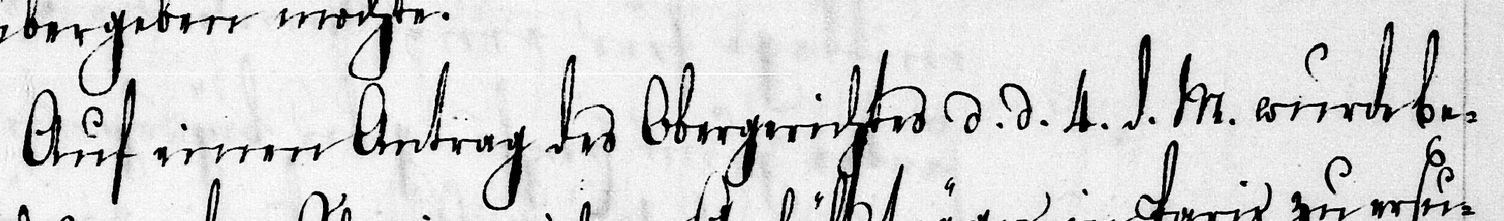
Auf einen Antrag des Obergerichtes d. d. 4. d. M. wurde bes¬
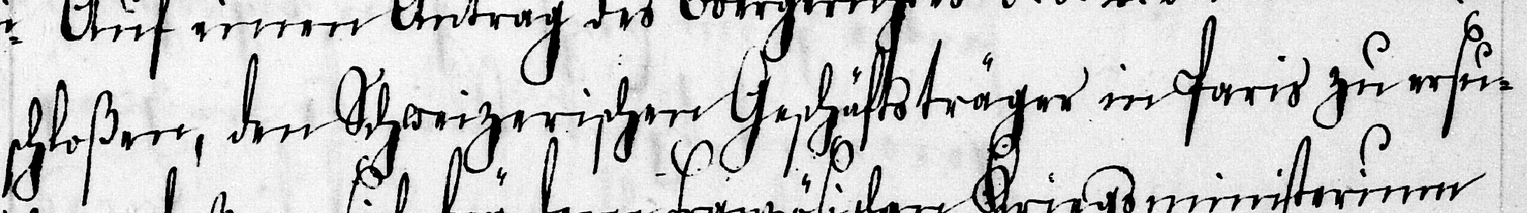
chloßen, den Schweizerischen Geschäftsträger in Paris zu ersu¬
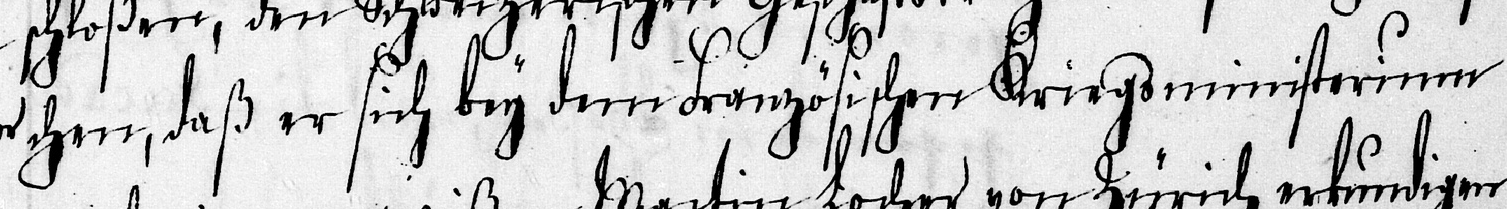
chen, daß er sich bey dem Französischen Kriegsministerium
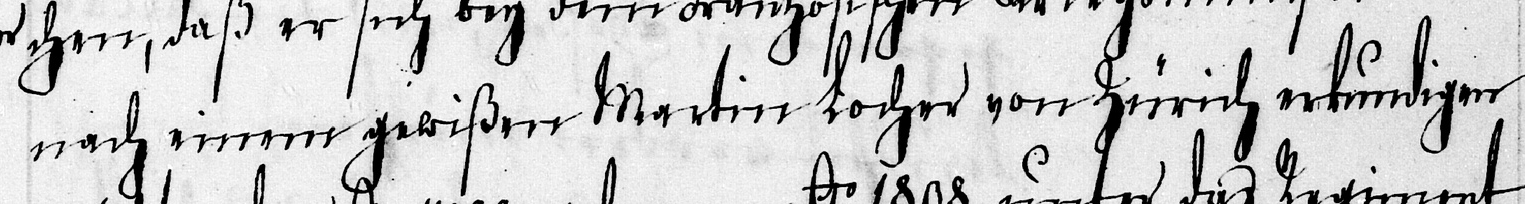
nach einem gewißen Martin Locher von Zürich erkundigen
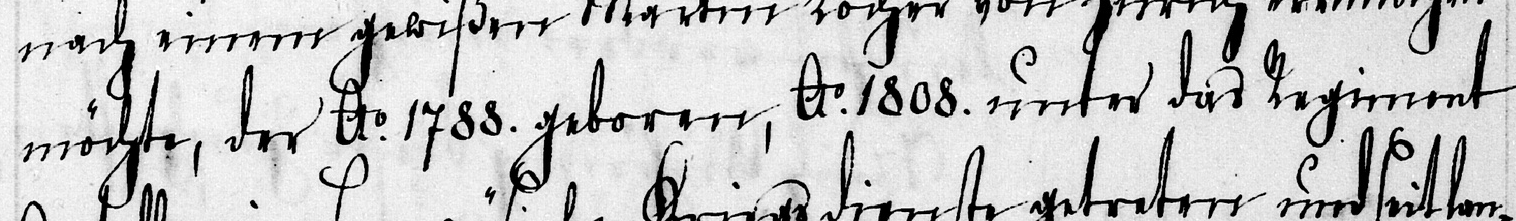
möchte, der Ao. 1788 geboren, Ao. 1808. unter das Regiment
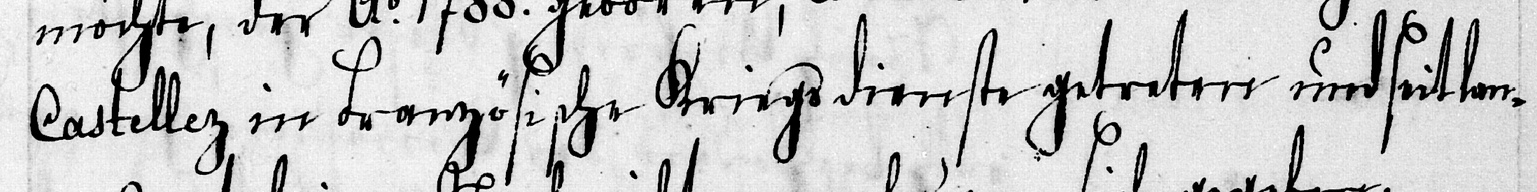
Castellez in Französische Kriegsdienste getreten und seit la¬
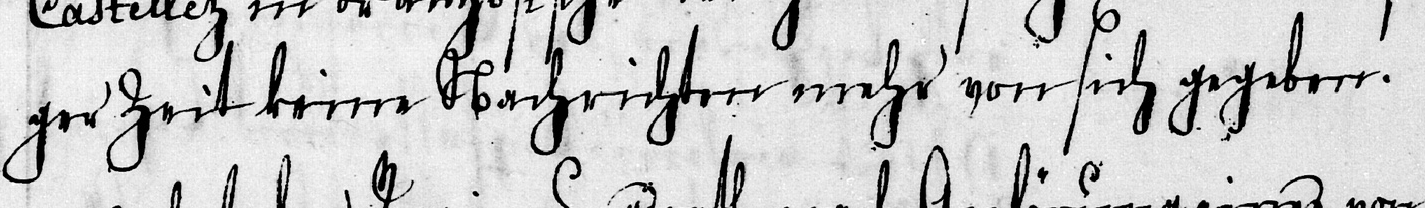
nger Zeit keine Nachrichten mehr von sich gegeben.
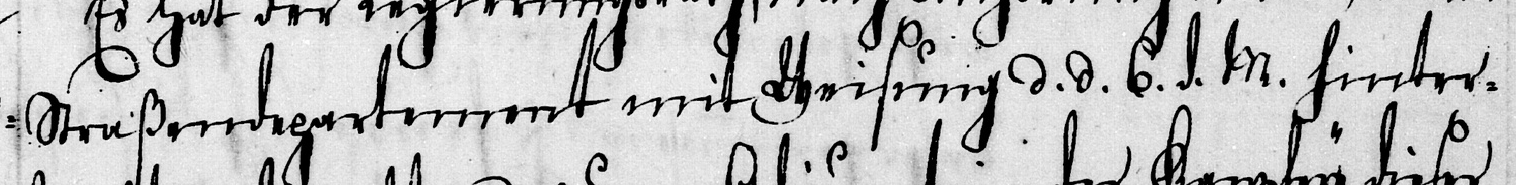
Straßendepartement mit Weisung d. d. 6. d. M. hinter¬
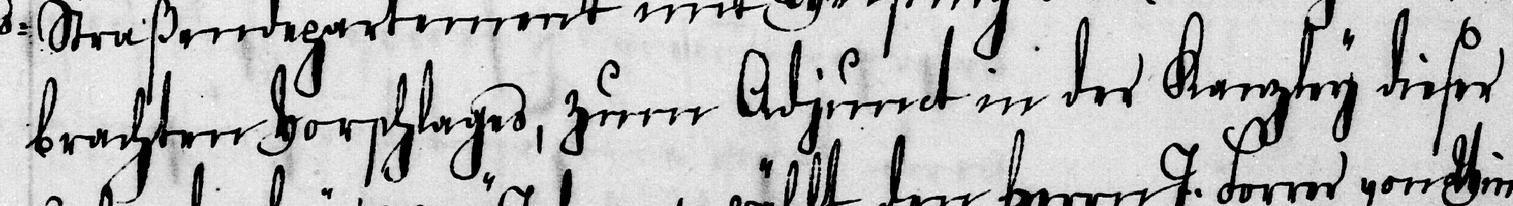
brachten Vorschlages, zum Adjunct in der Kanzley dieser
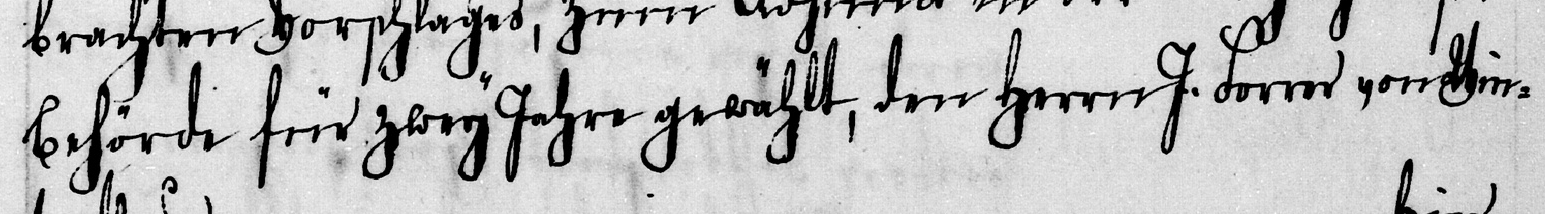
Behörde für zwey Jahre gewählt, den Herrn J. Forrer von Win¬
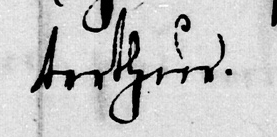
terthur.
